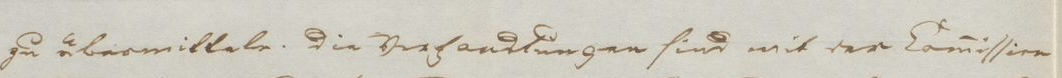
zu übermitteln. Die Verhandlungen sind mit der Commission
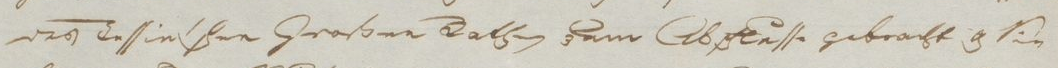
des Tessin'schen Großen Rathes zum Abschlusse gebracht & Sie
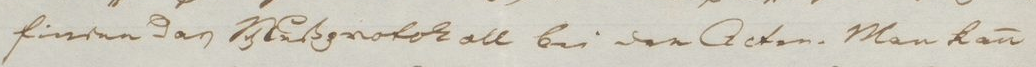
finden das Schlußprotokoll bei den Acten. Man kann
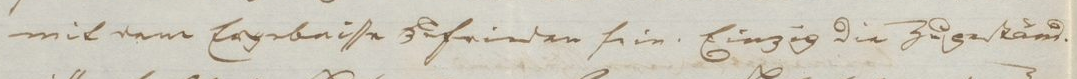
mit dem Ergebnisse zufrieden sein. Einzig die Zugeständ-
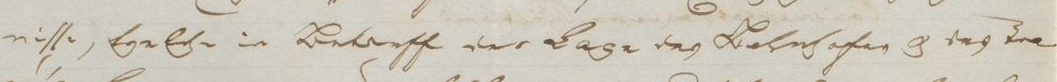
nisse, welche in Betreff der Lage des Bahnhofes & der Tra-
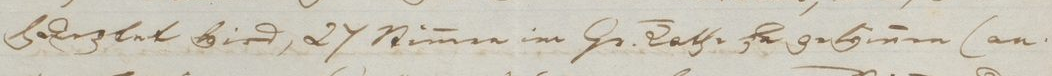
hauptet wird, 27 Stimmen im Gr. Rathe zu gewinnen (an-
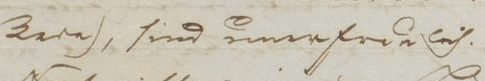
Rede, sind unerfreulich.
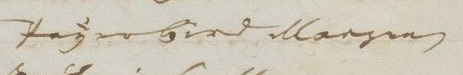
Peyer wird Morgen
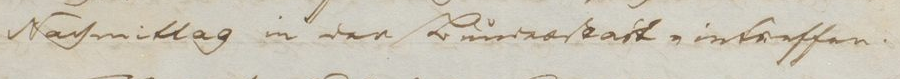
Nachmittag in der Bundesstadt eintreffen.
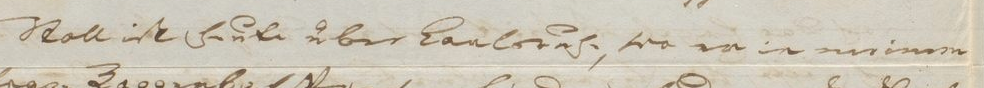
Stoll ist heute über Carlsruhe, wo er in meinem
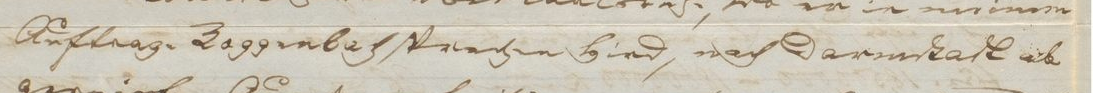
Auftrage Roggenbach sprechen wird, nach Darmstadt ab-
